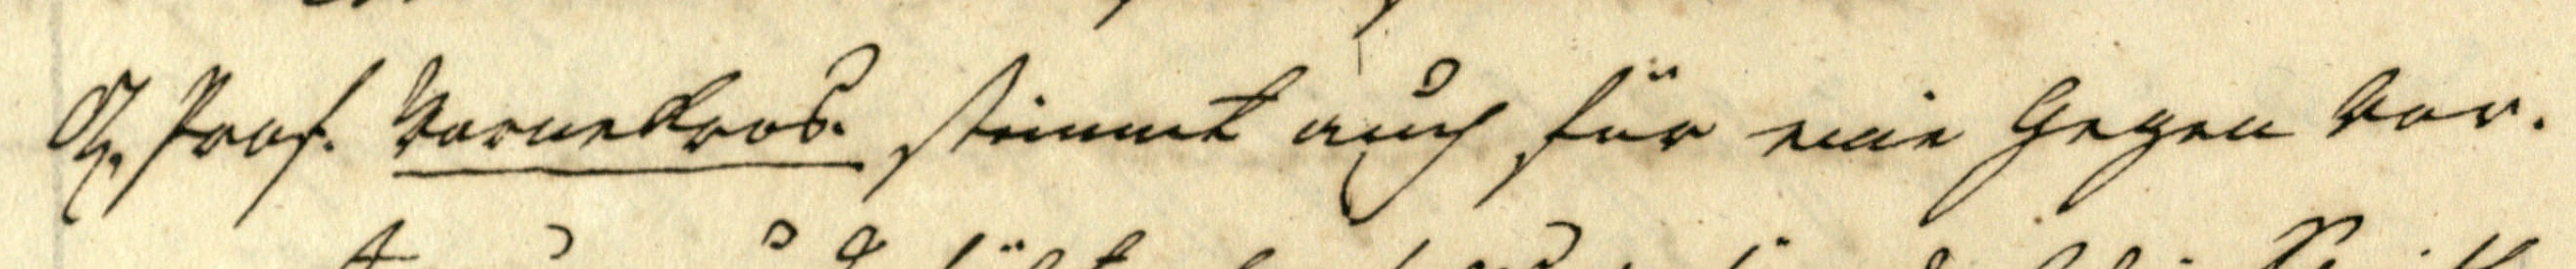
dh. Prof. Warnekros stimmt auch für eine Gegen Vor¬
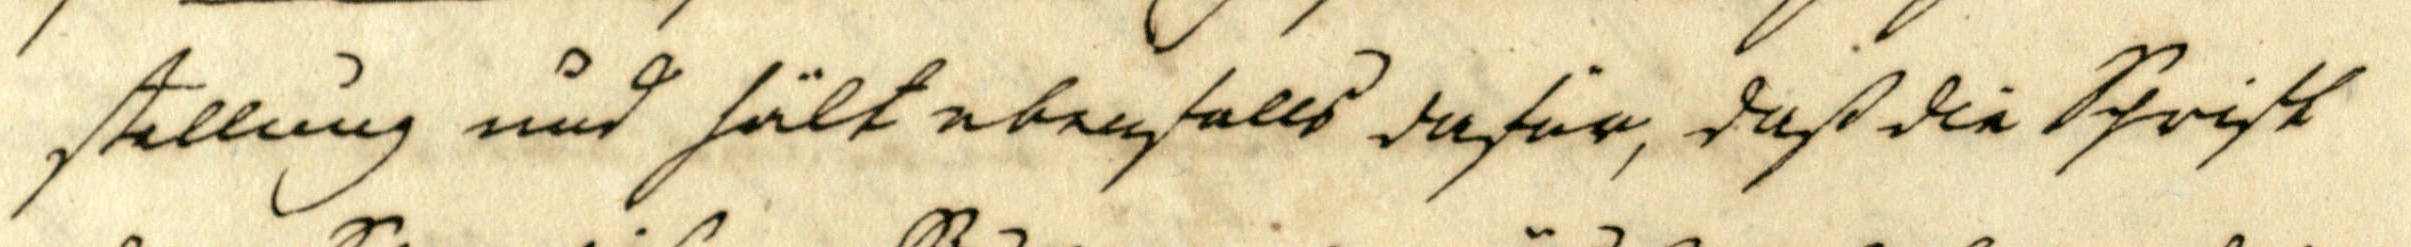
stellung und hält ebenfalls dafür, daß die Schrift
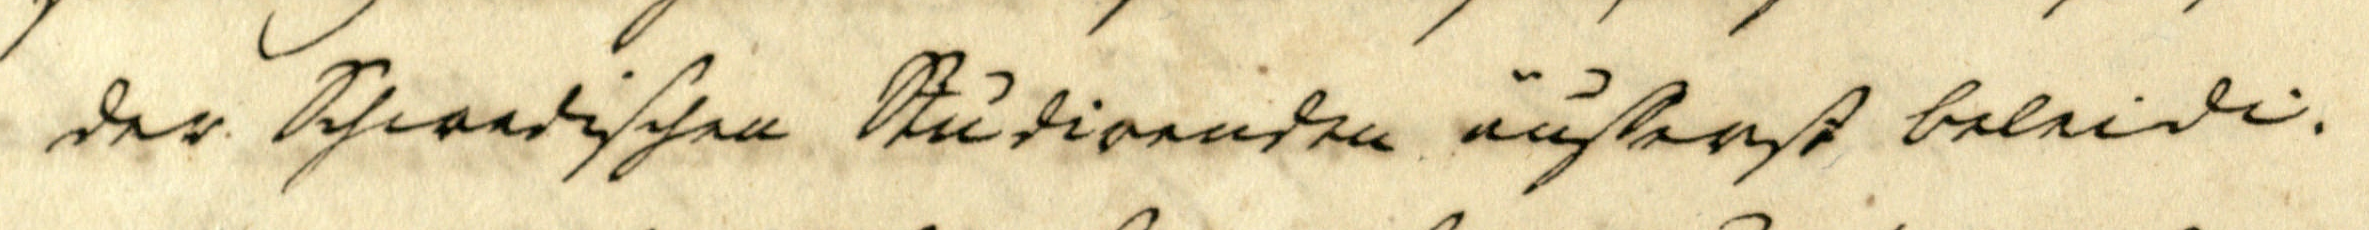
der Schwedischen Studirenden äusserst beleidi¬
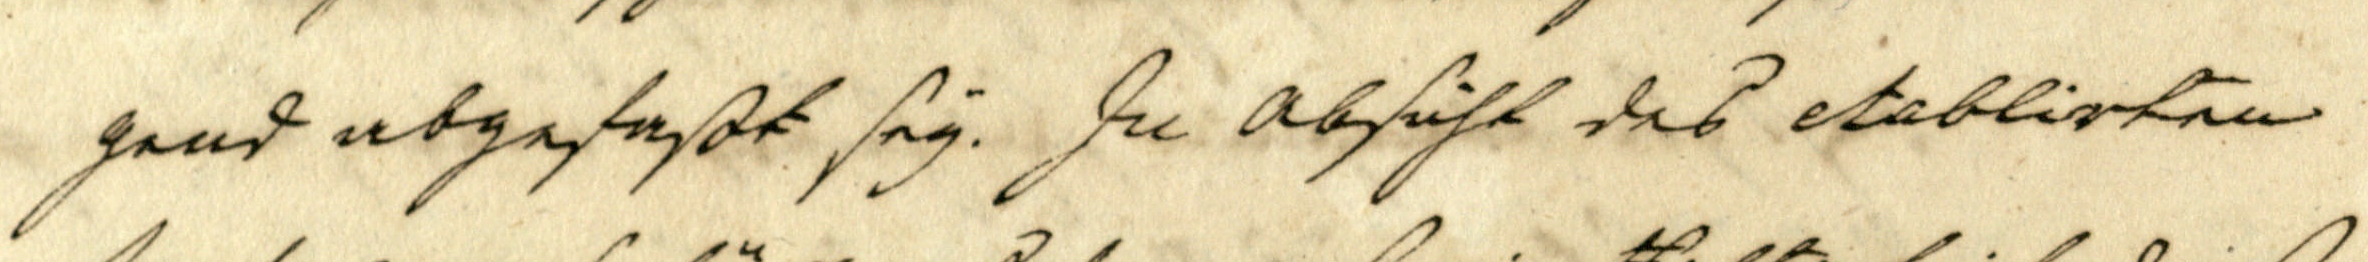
gend abgefaßt seÿ. In Absicht des etablirten
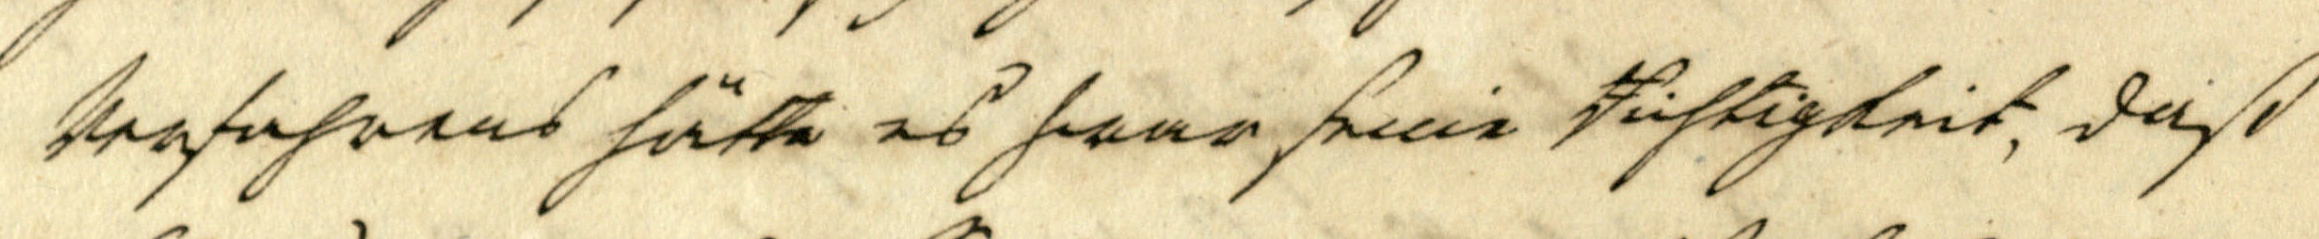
Verfahrens hätte es zwar seine Richtigkeit, daß
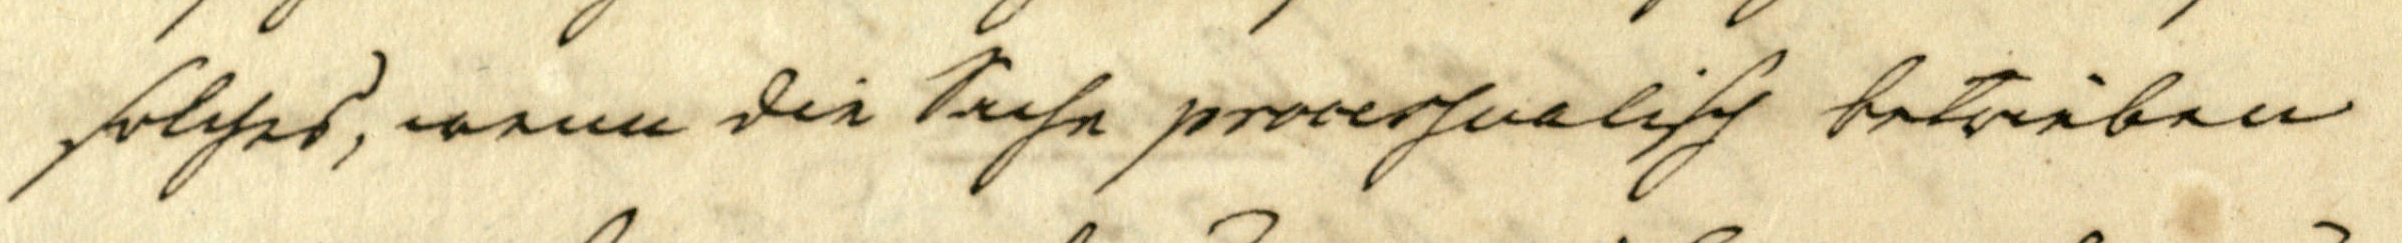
solches, wenn die Sache porocessualisch betrieben
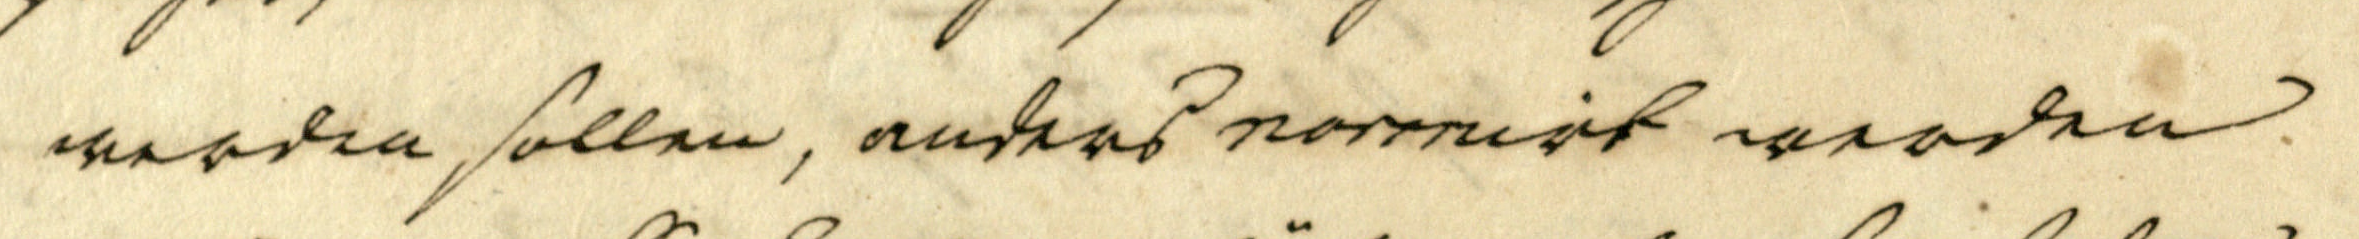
werden sollen, anders normirt werden
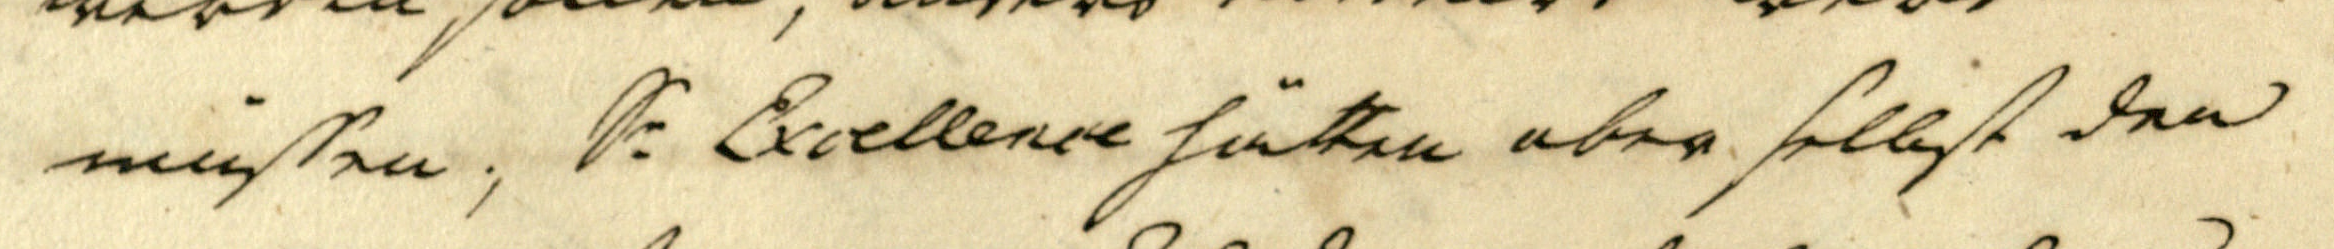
müssen, Sr Excellence hätten aber selbst den
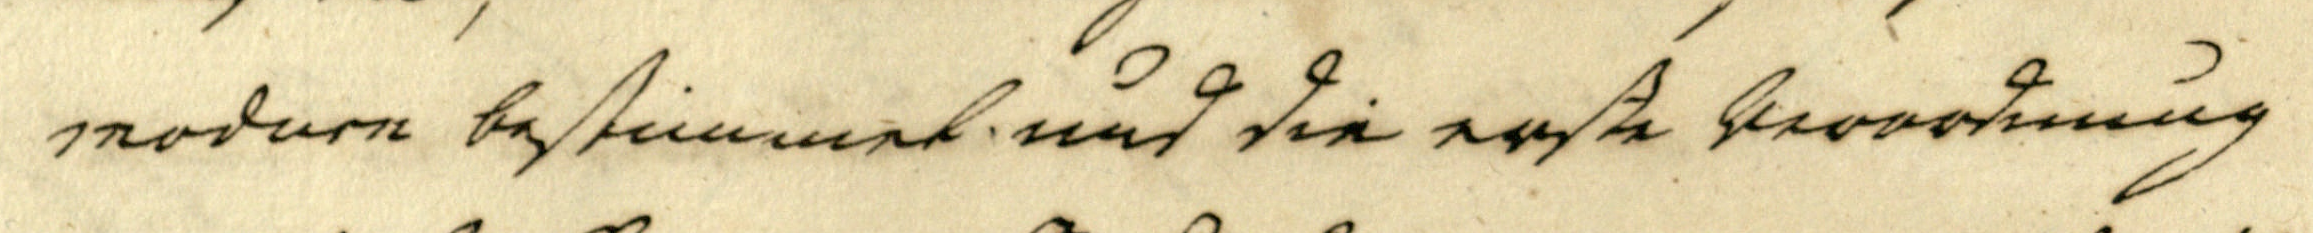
modum bestimmet und die erste Verordnung
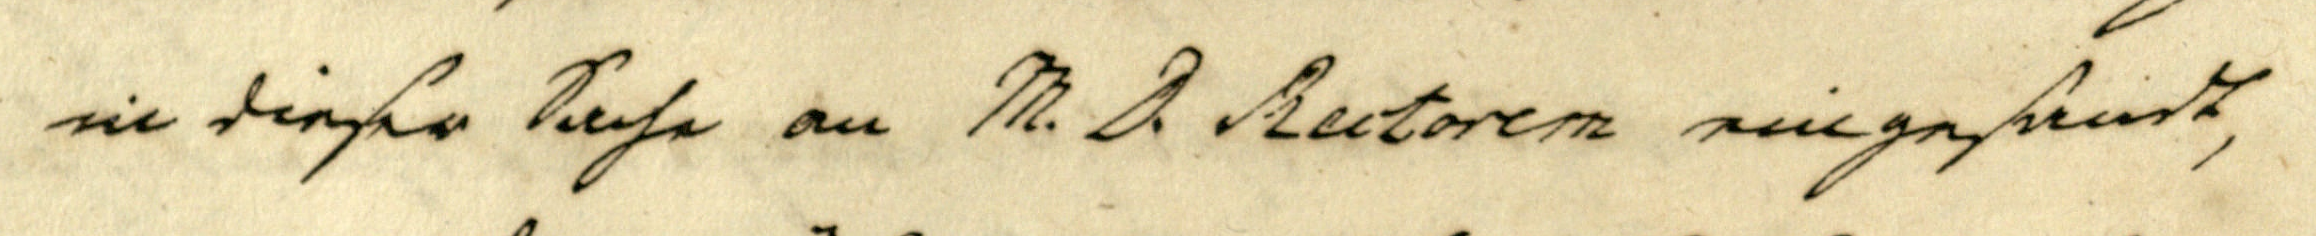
in dieser Sache an M. D. Rectorem eingesandt,
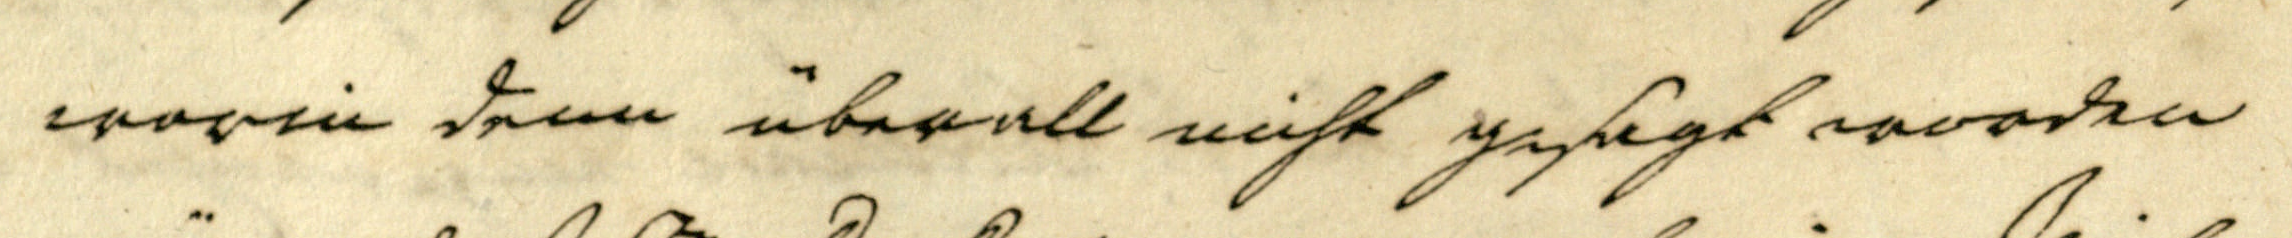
worin denn überall nicht gesagt worden
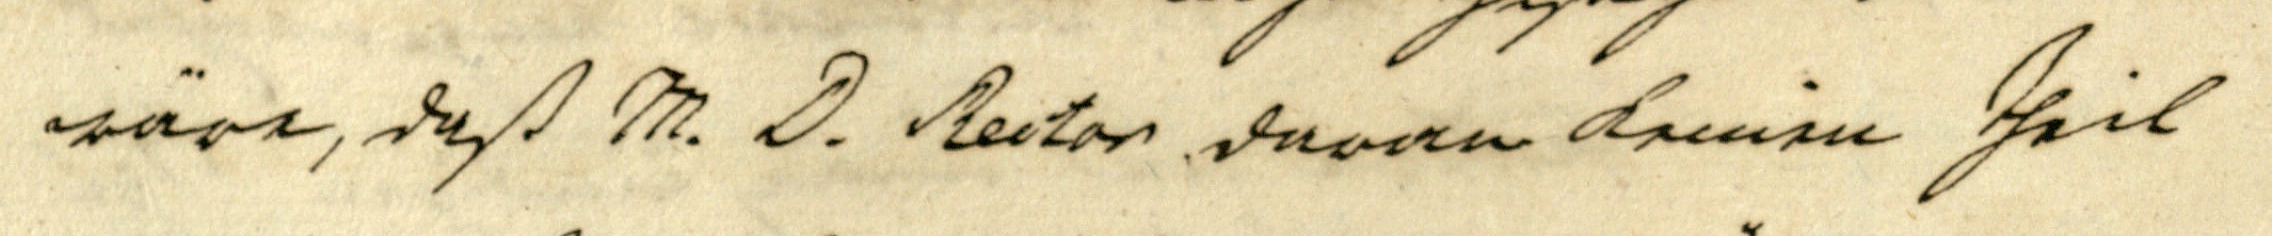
wäre, daß M. D. Rector daran keinen Theil
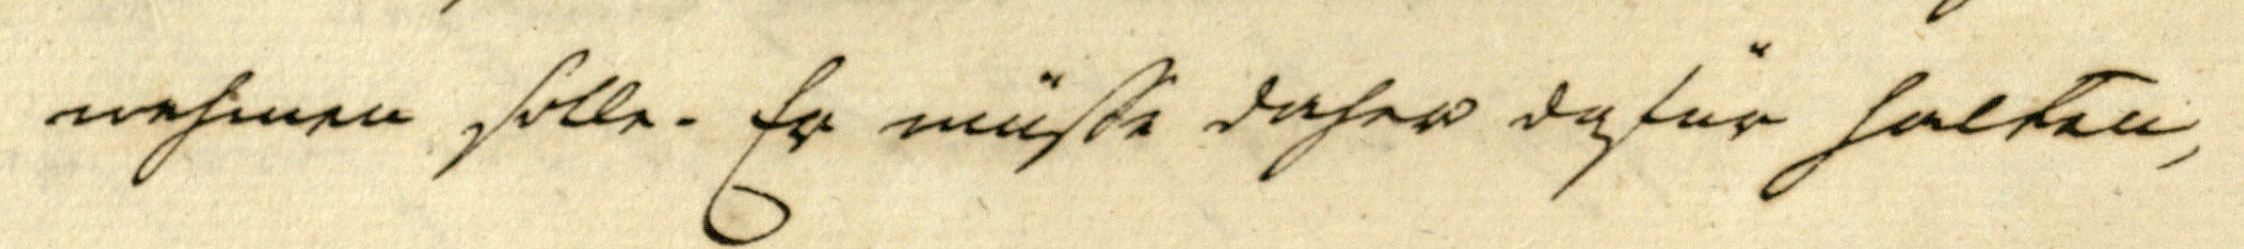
nehmen solle. Er müsse daher dafür halten,
